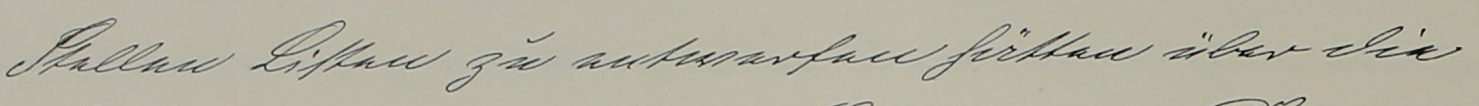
Stellen Listen zu entwerfen hätten über die
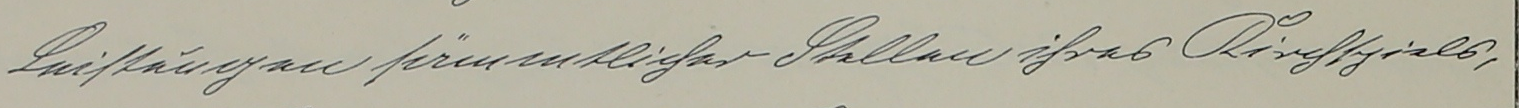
Leistungen sämmtlicher Stellen ihres Kirchspiels,
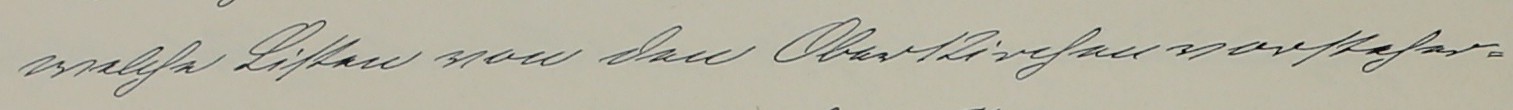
welche Listen von den Oberkirchenvorsteher-
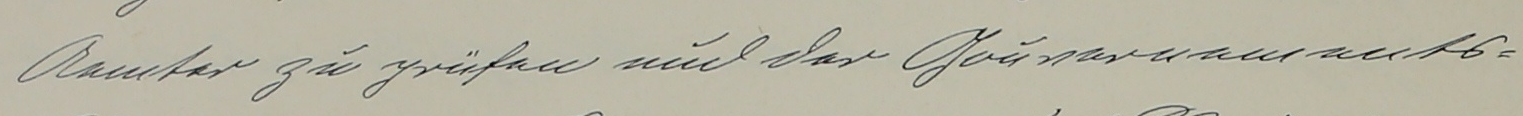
Aemter zu prüfen und der Gouvernements-
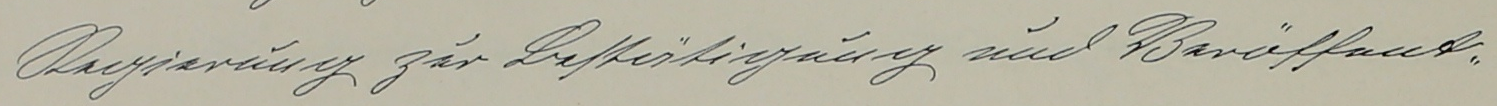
Regierung zur Bestätigung und Veröffent-
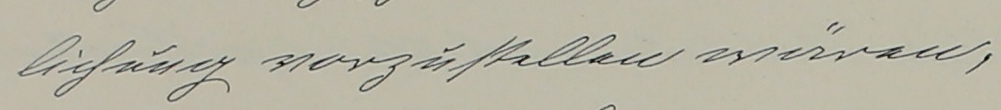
lichung vorzustellen wären,
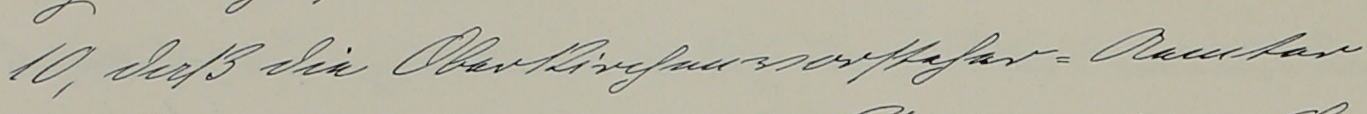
10. daß die Oberkirchenvorsteher-Aemter
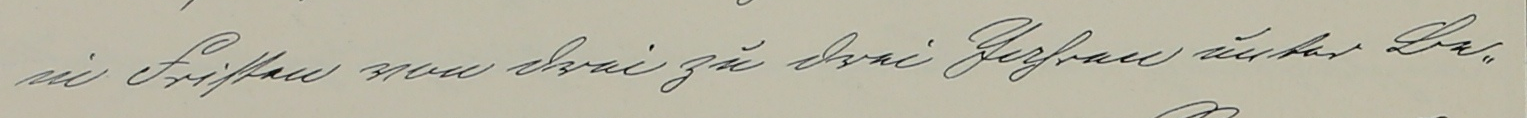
in Fristen von drei zu drei Jahren unter Be-
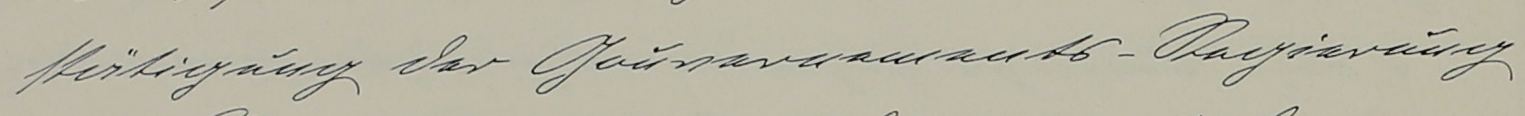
stätigung der Gouvernements-Regierung
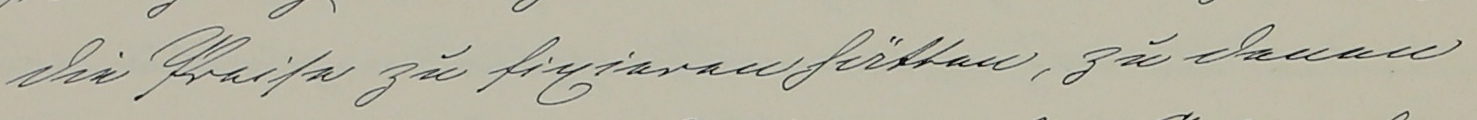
die Preise zu fixieren hätten, zu denen
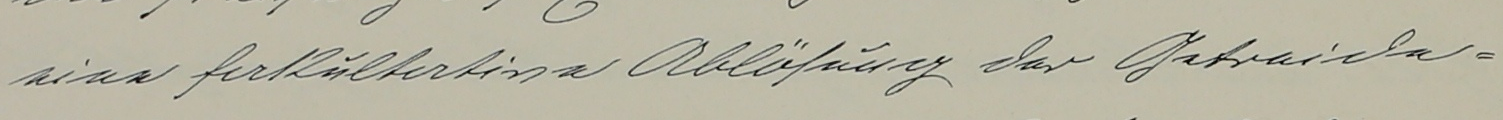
eine fakultative Ablösung der Getreide-
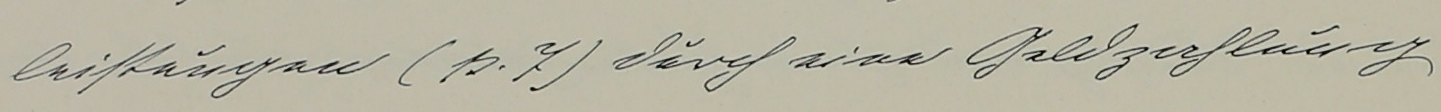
leistungen (p. 7) durch eine Geldzahlung
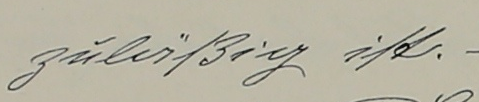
zuläßig ist.
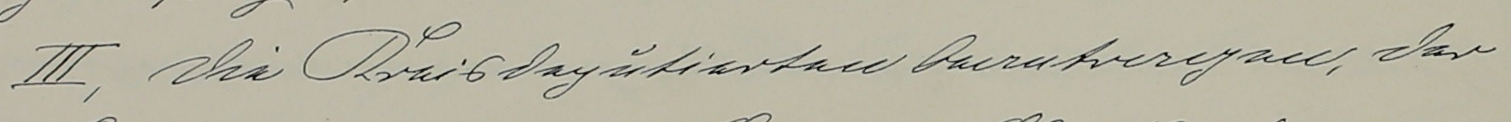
III. Die Kreisdeputierten beantragen, der
